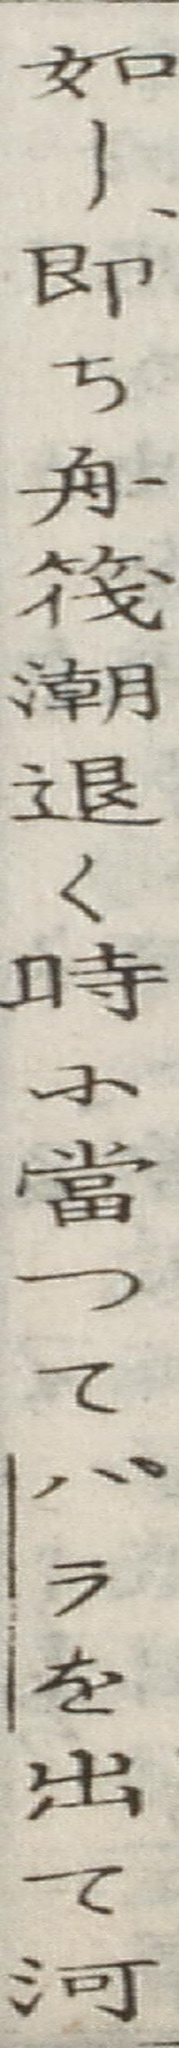如し、即ち舟筏潮退く時に当つてパラを出て河
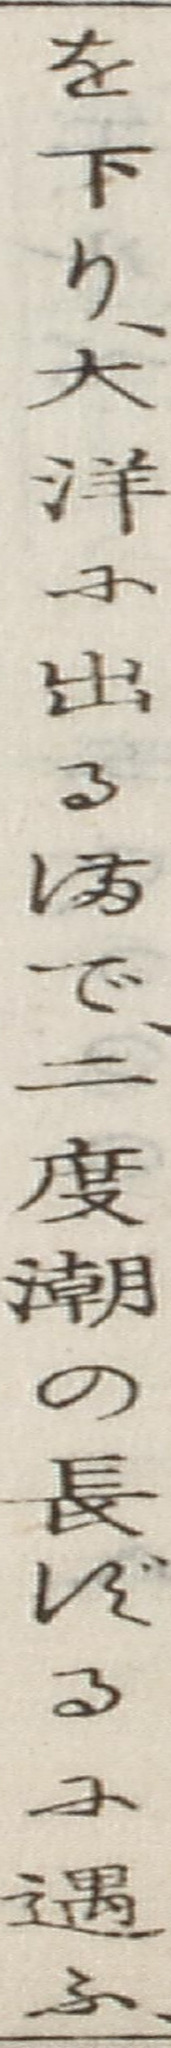を下り、大洋に出るまで、二度潮の長ずるに遇ふ、
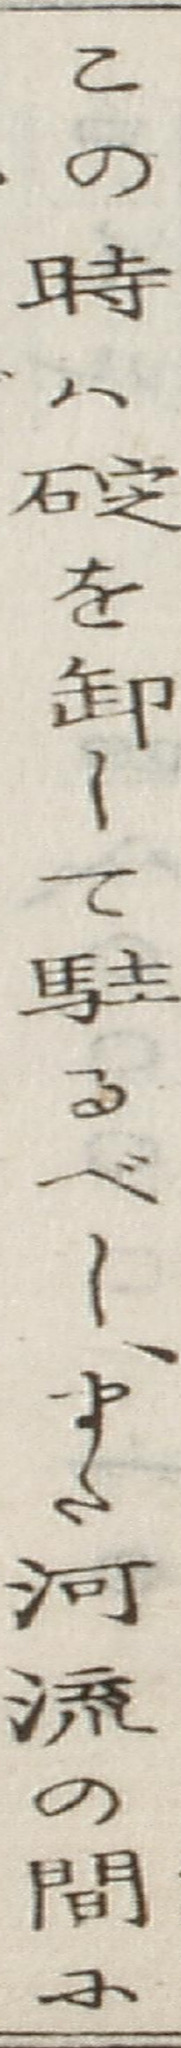この時は碇を卸して駐るべし、また河流の間に
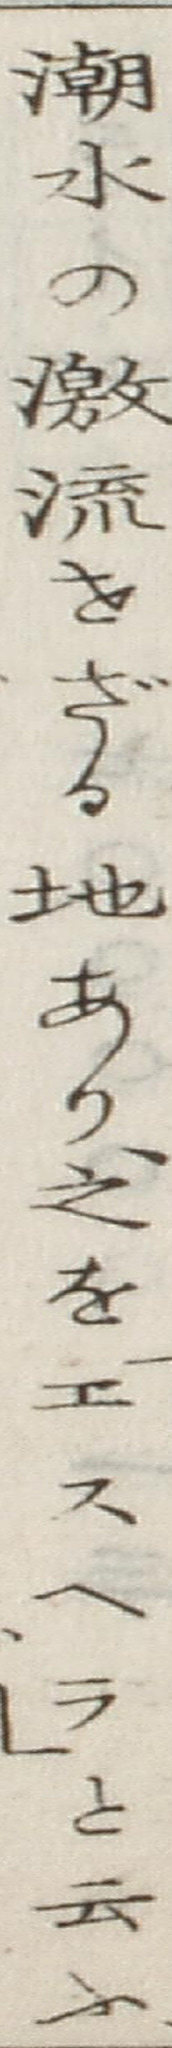潮水の激流せざる地あり、之を「エスヘラ」と云ふ、
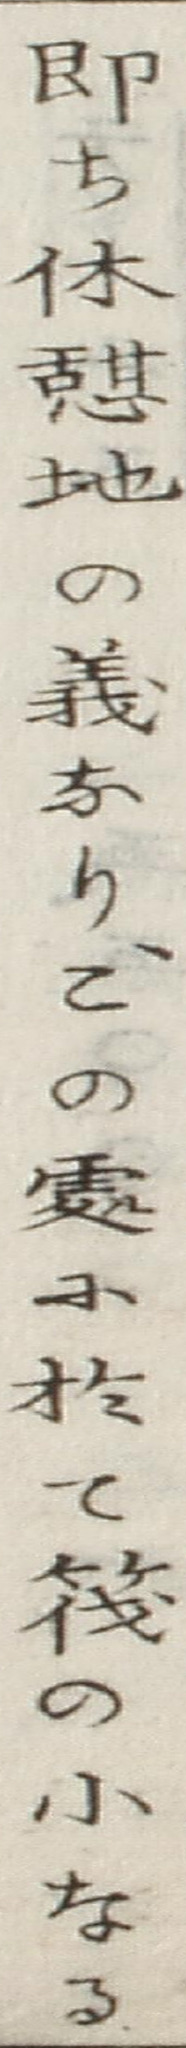即ち休憩地の義なり、この処に於て筏の小なる
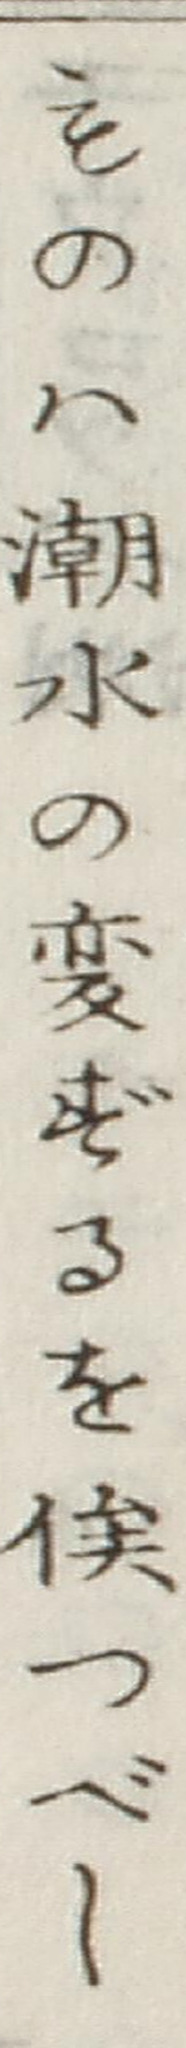ものは潮水の変ずるを待つべし
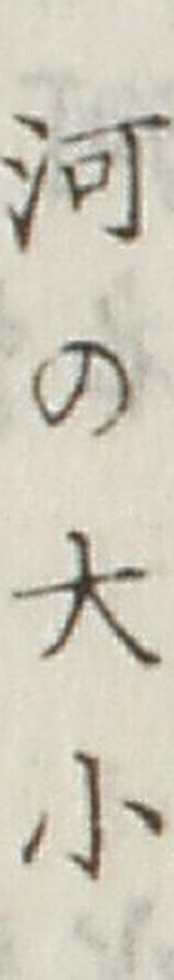河の大小
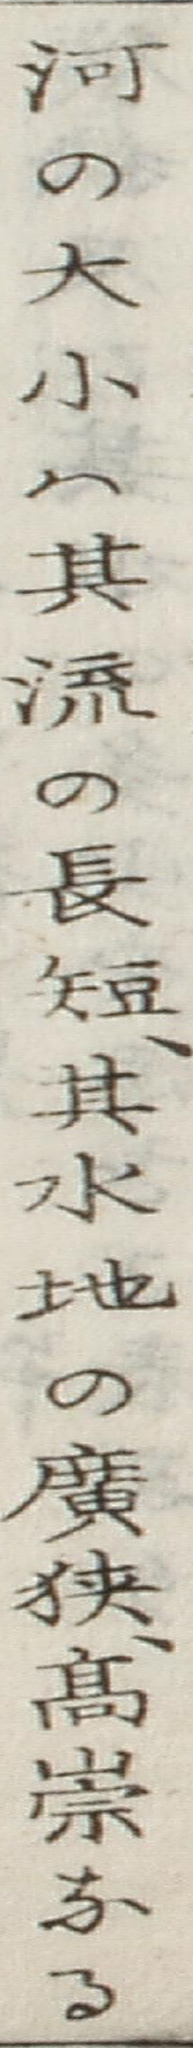河の大小は其流の長短、其水地の広狭、高崇なる
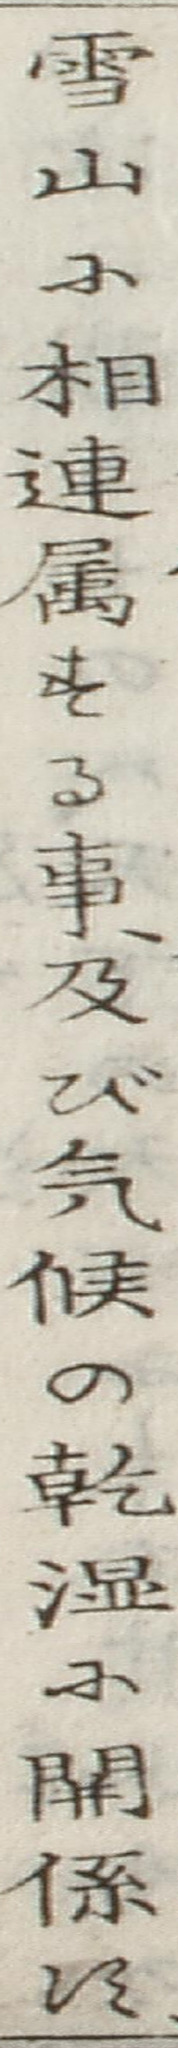雪山に相連属する事、及び気候の乾湿に関係す、
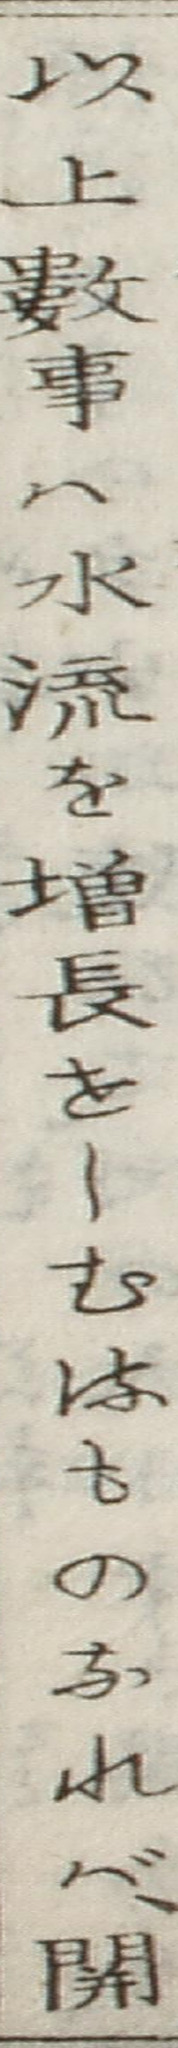以上数事は水流を増長せしむるものなれば、関

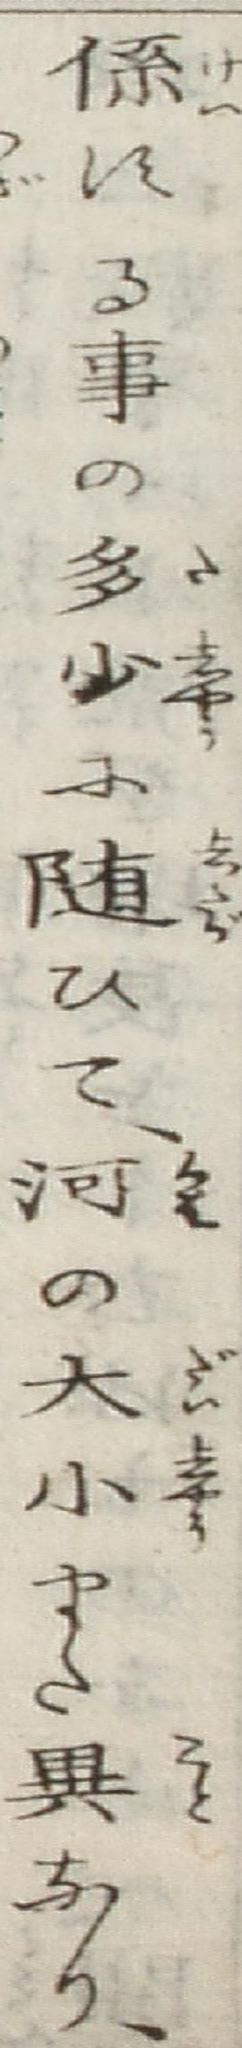係する事の多少に随ひて、河の大小また異なり、
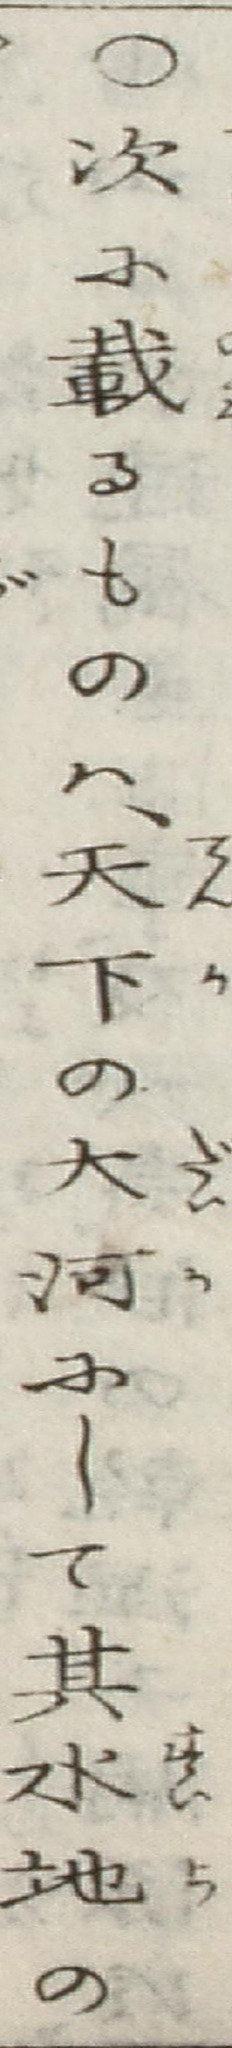○次に載るものは、天下の大河にして其水地の
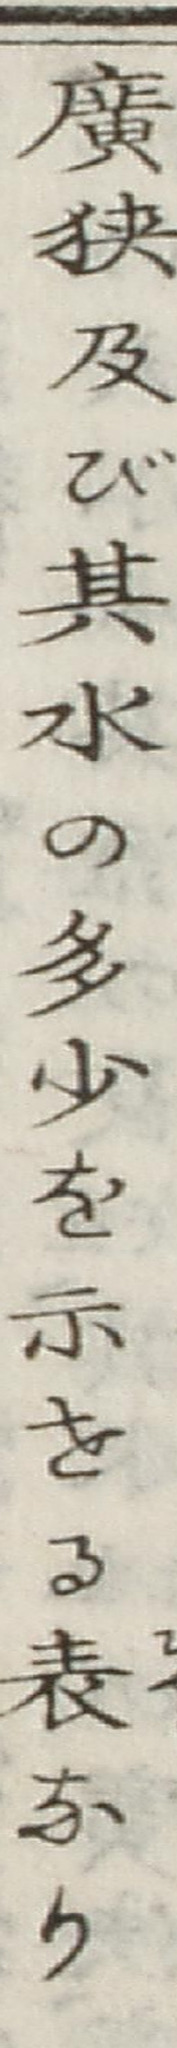広狭及び其水の多少を示せる表なり
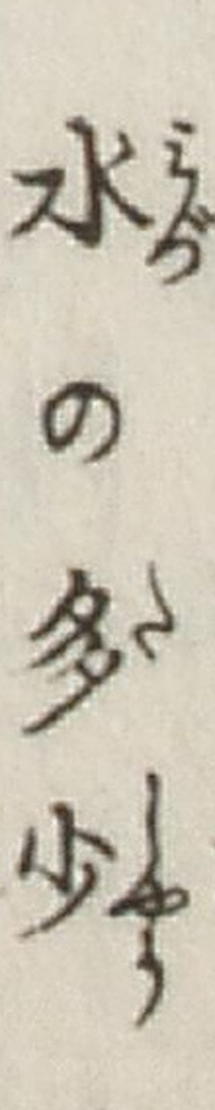水の多少
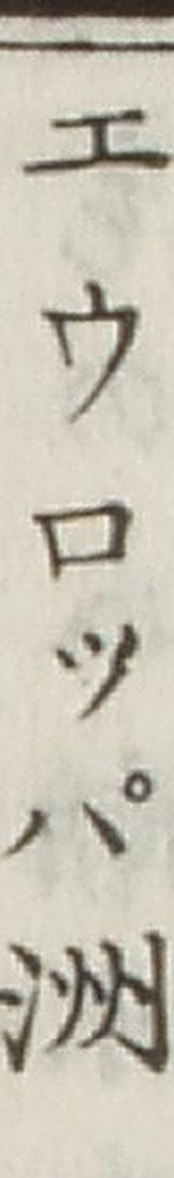エウロツパ洲
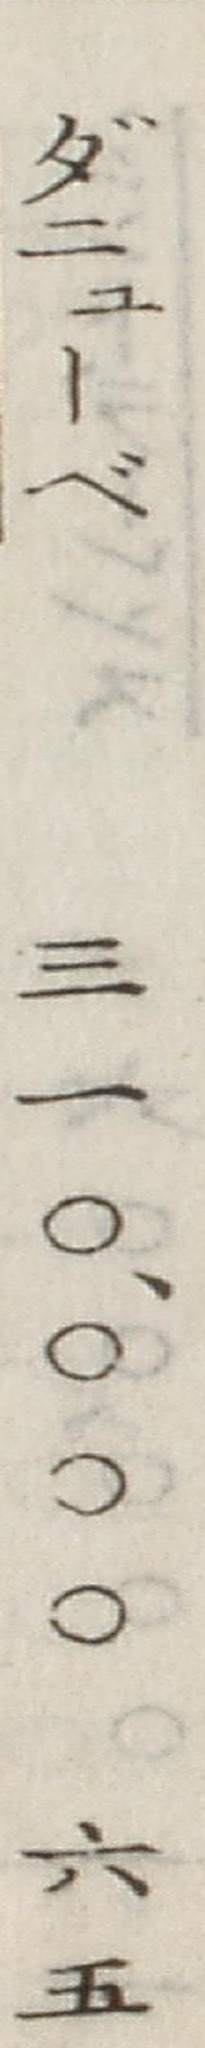ダニューベ三一〇、〇〇〇六五
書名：訓蒙　天然地理學　中
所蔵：東京大学地震研究所図書室 Earthquake Research Institute Library, The University of Tokyo, JAPAN
